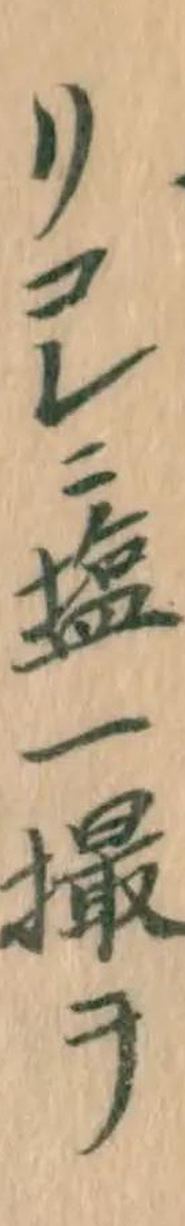リコレニ塩一撮ヲ
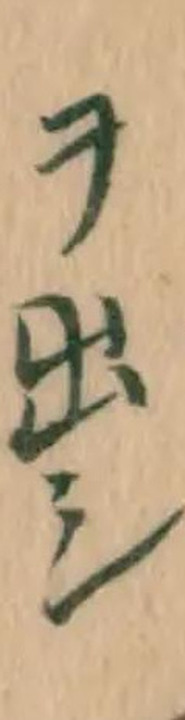ヲ出シ
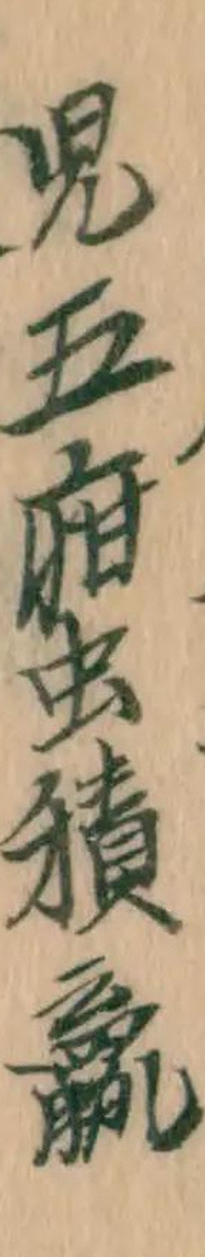児五疳虫積羸
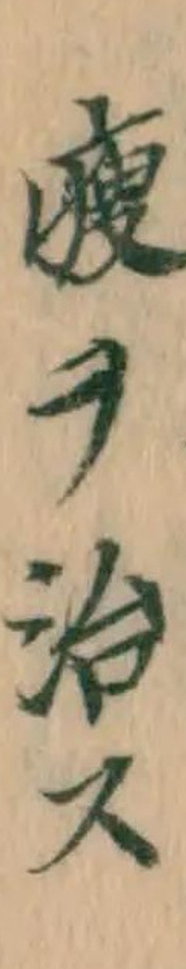痩ヲ治ス

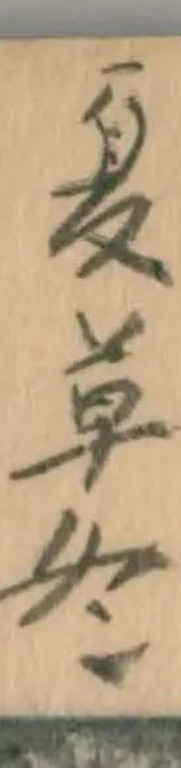夏草冬
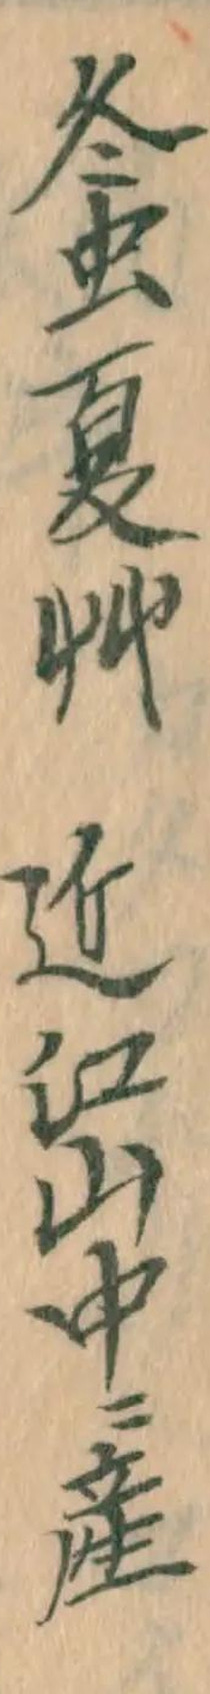冬虫夏艸近江山中ニ産
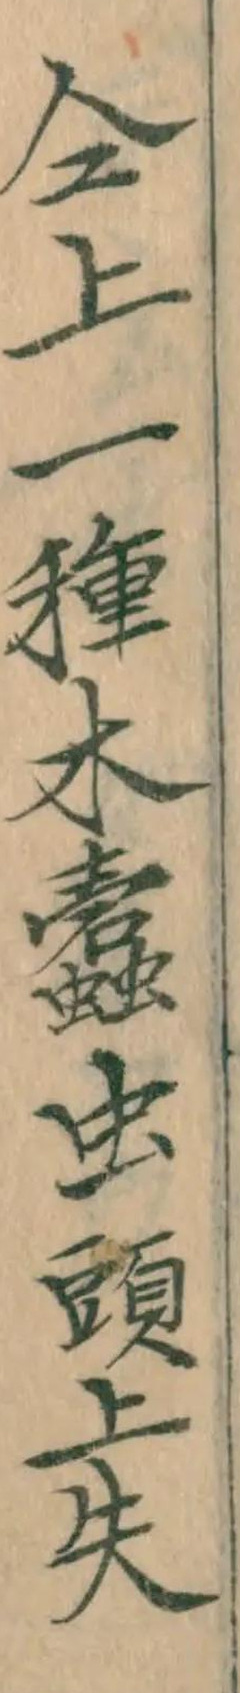仝上一種木蠹虫頭上失
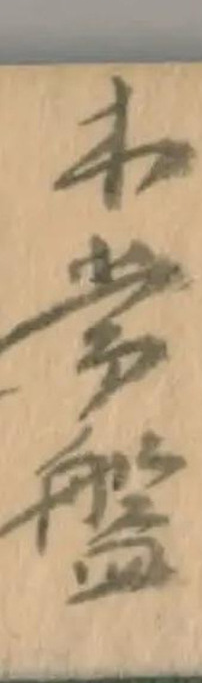木常盤
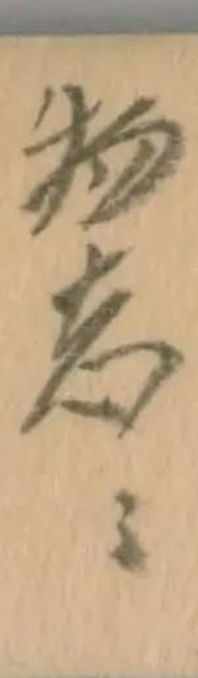物志之
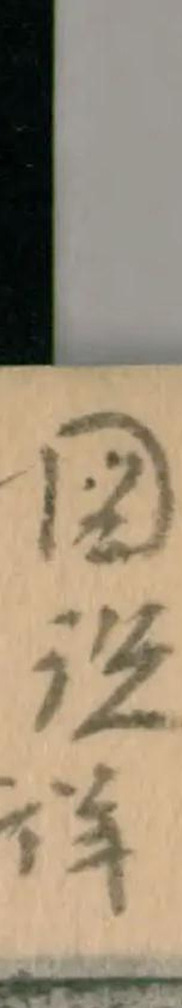図説詳
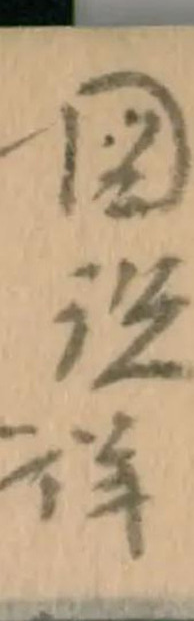図説詳
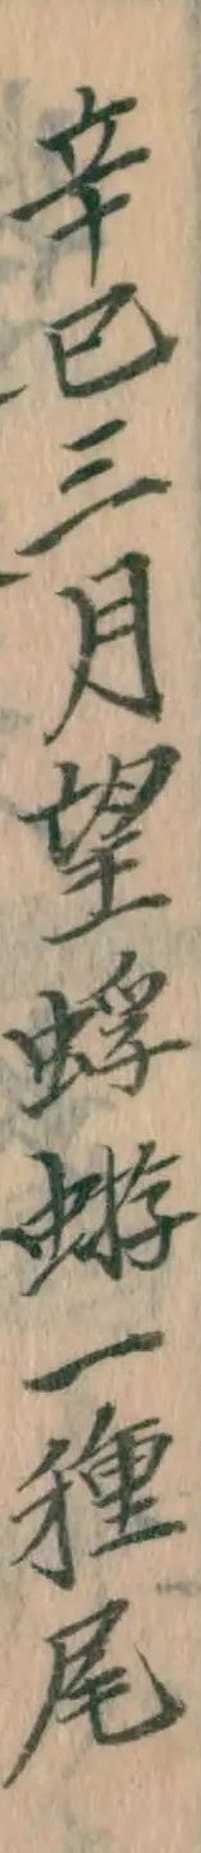辛巳三月望蜉蝣一種尾
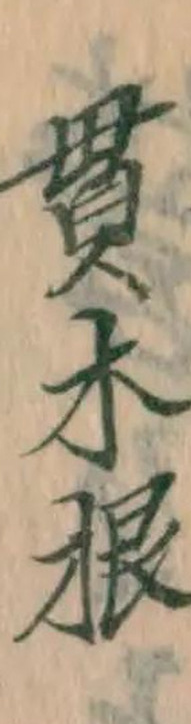貫木根
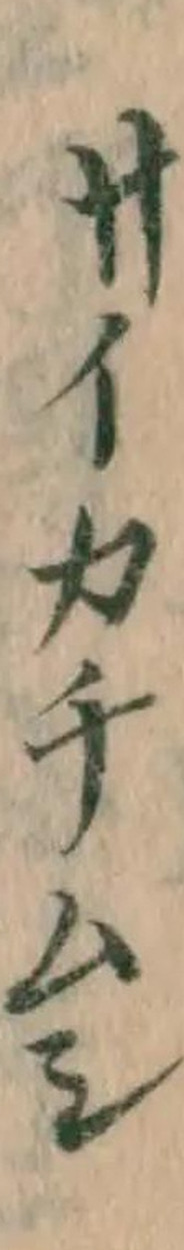サイカチムシ
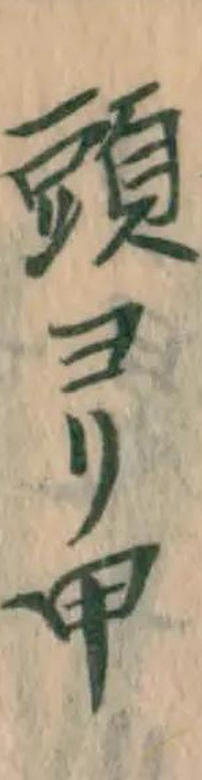頭ヨリ甲
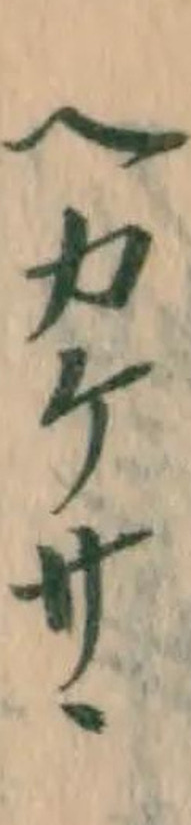ニカケサヽ
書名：千蟲譜 3巻. [2]
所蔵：国立国会図書館 National Diet Library, JAPAN
